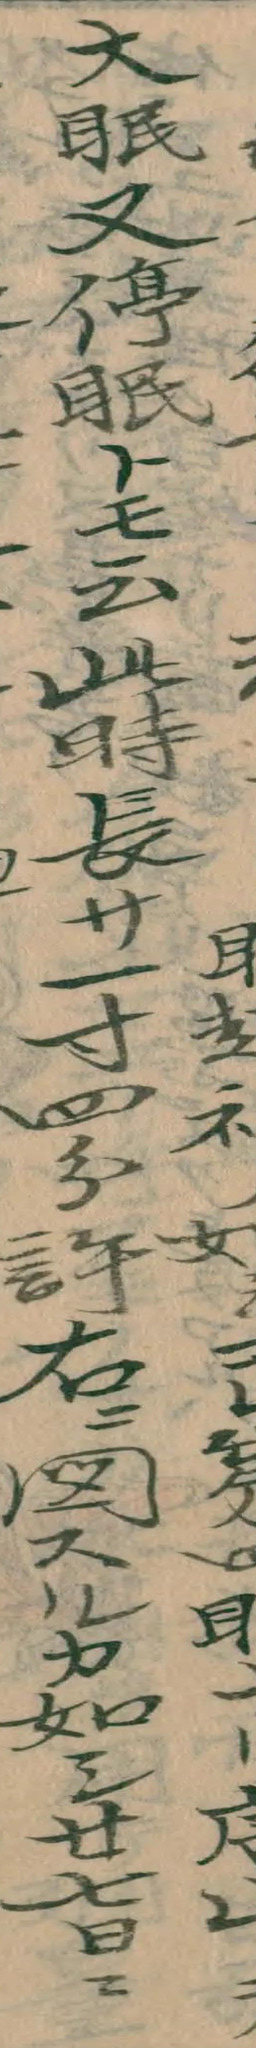大眠又停眠トモ云此時長サ一寸四分許右ニ図スルカ如シ廿七日ニ
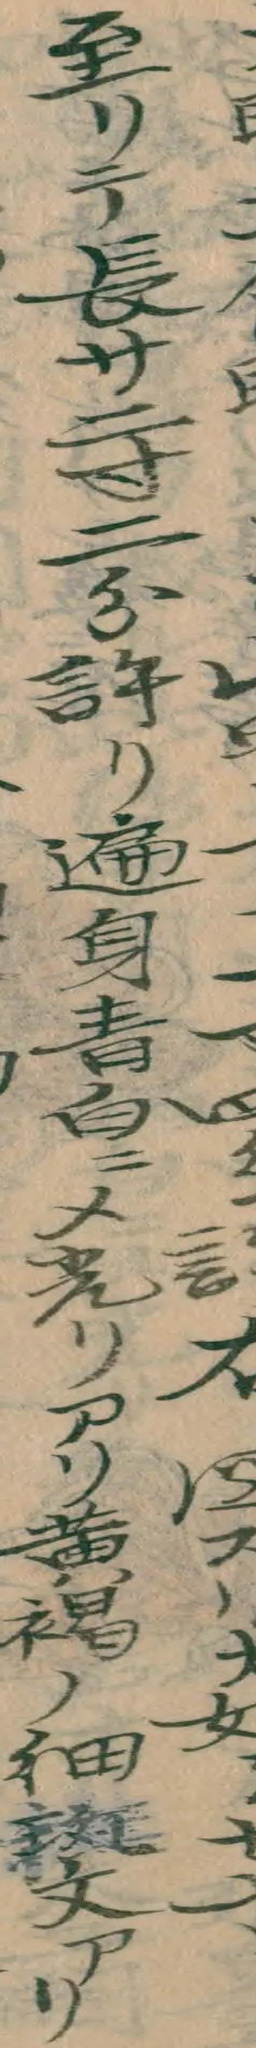至リテ長サ二寸二分許リ遍身青白ニシテ光リアリ黄褐ノ細斑文アリ
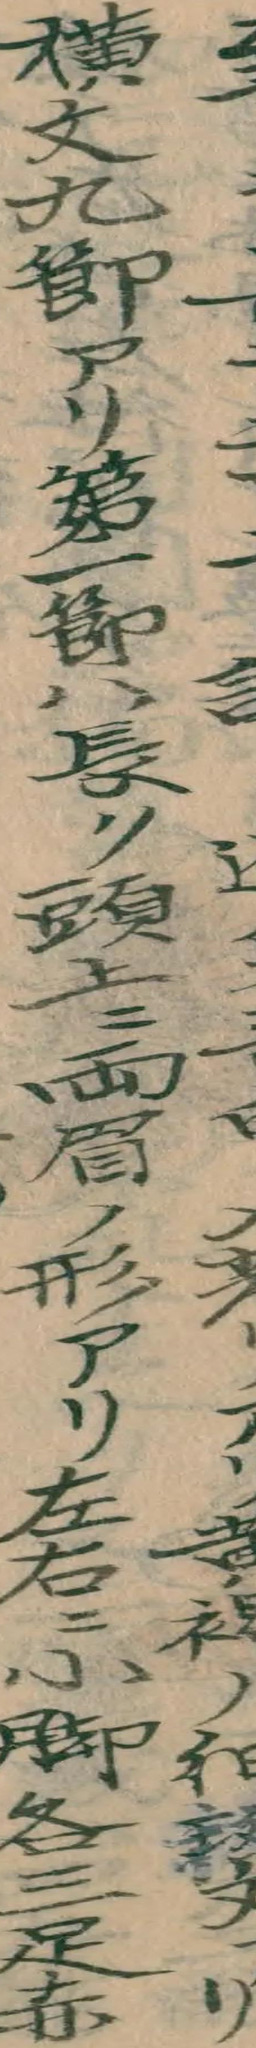横文九節アリ第一節ハ長ク頭上ニ両眉ノ形アリ左右ニ小脚各三足赤
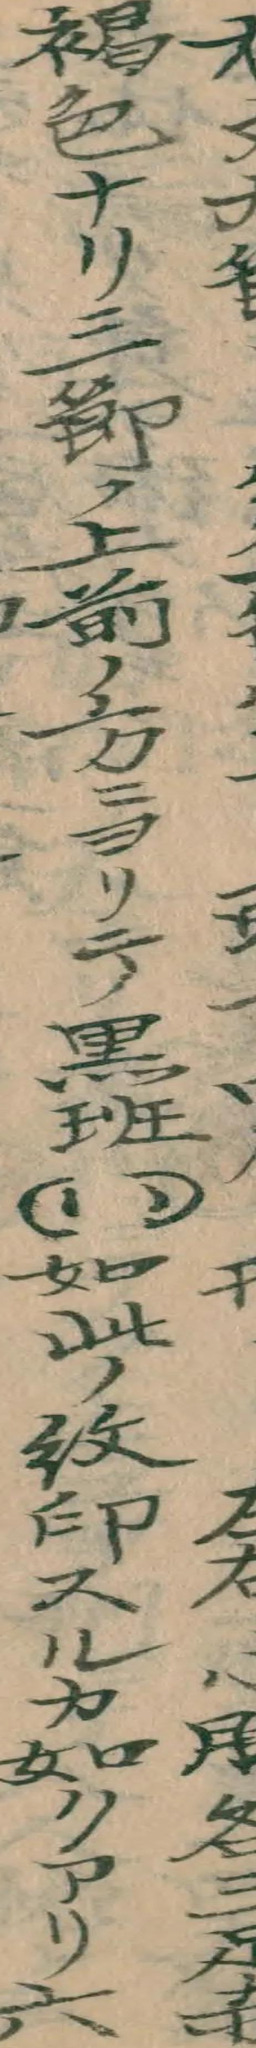褐色ナリ三節ノ上前ノ方ニヨリテ黒班如此ノ紋印スルカ如クアリ六
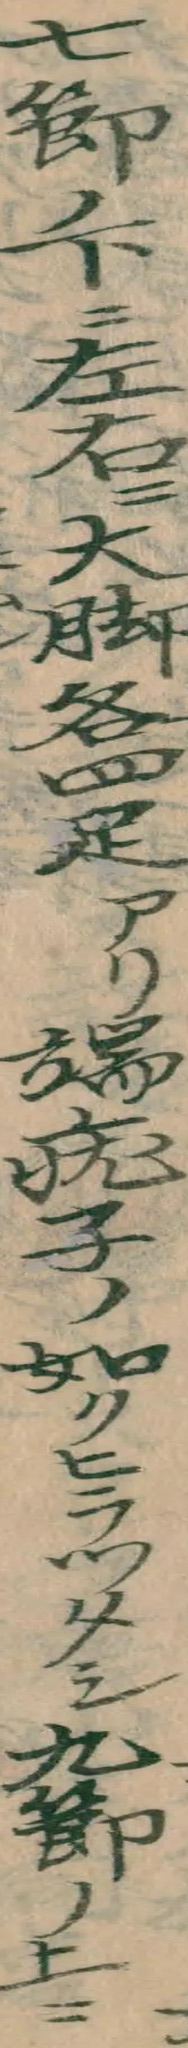七節ノ下ニ左右ニ大脚各四足アリ端疣子ノ如クヒラツタシ九節ノ上ニ
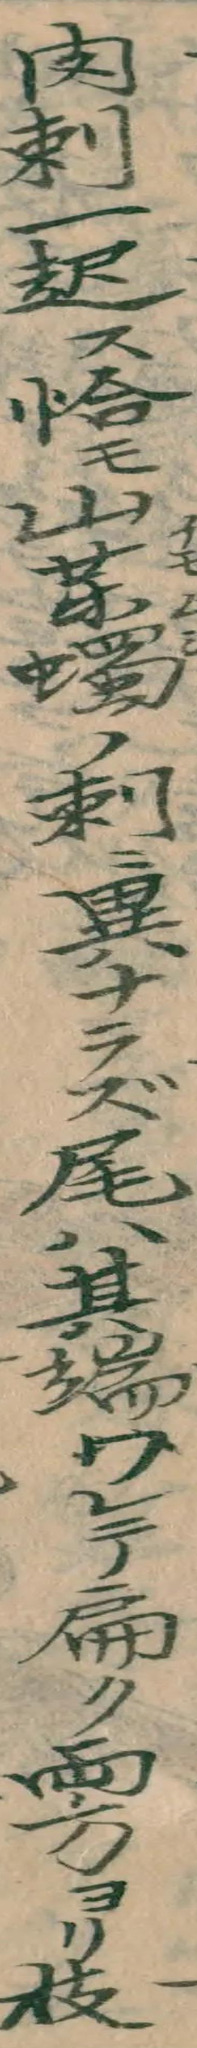肉刺一起ス恰モ山薬蠋ノ刺ニ異ナラズ尾ハ其端ワレテ扁ク両方ヨリ枝
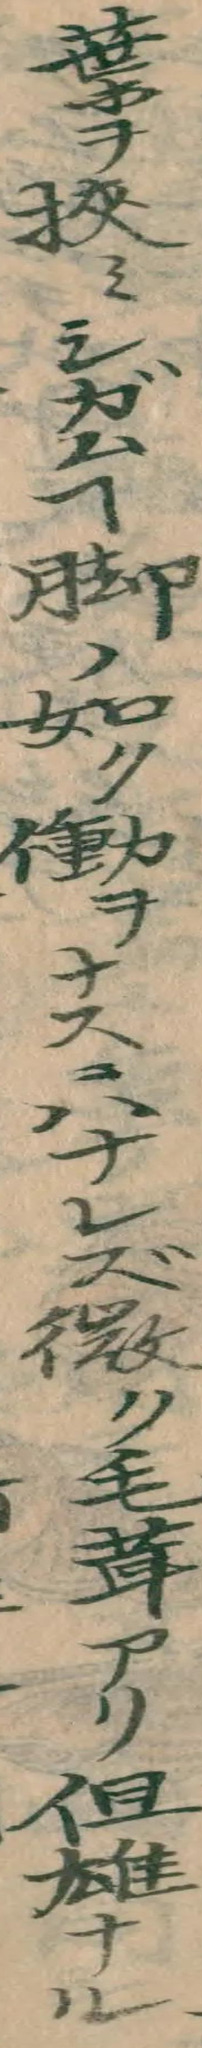葉ヲ挟ミシガムコト脚ノ如ク働ヲナスニハナレズ微ク毛茸アリ但雄ナル
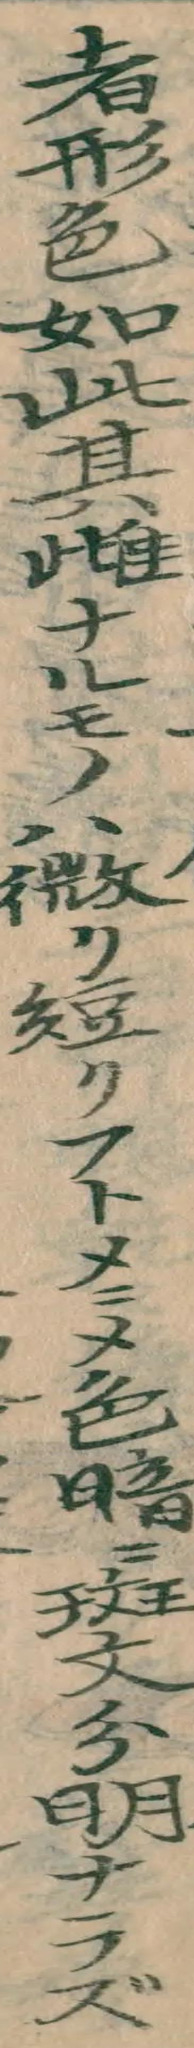者形色如此其雌ナルモノハ微リ短クフトメニシテ色暗ニ斑文分明ナラズ
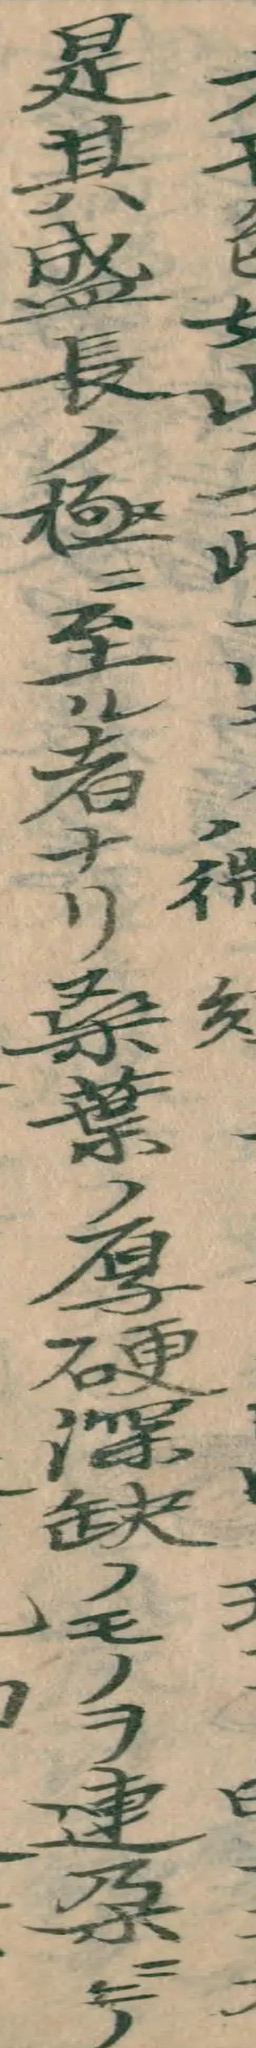是其盛長ノ極ニ至ル者ナリ桑葉ノ厚硬深缼ノモノヲ連朶ニテ
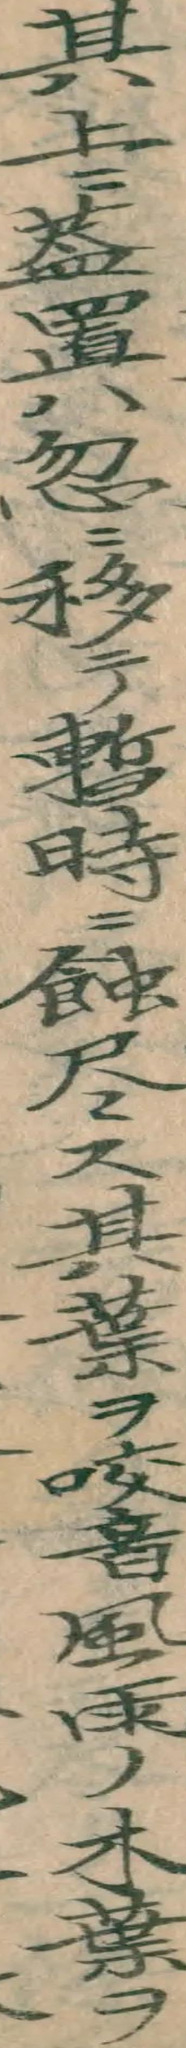其上ニ葢置ハ忽ニ移テ暫時ニ蝕尽ス其葉ヲ咬音風雨ノ木葉ヲ
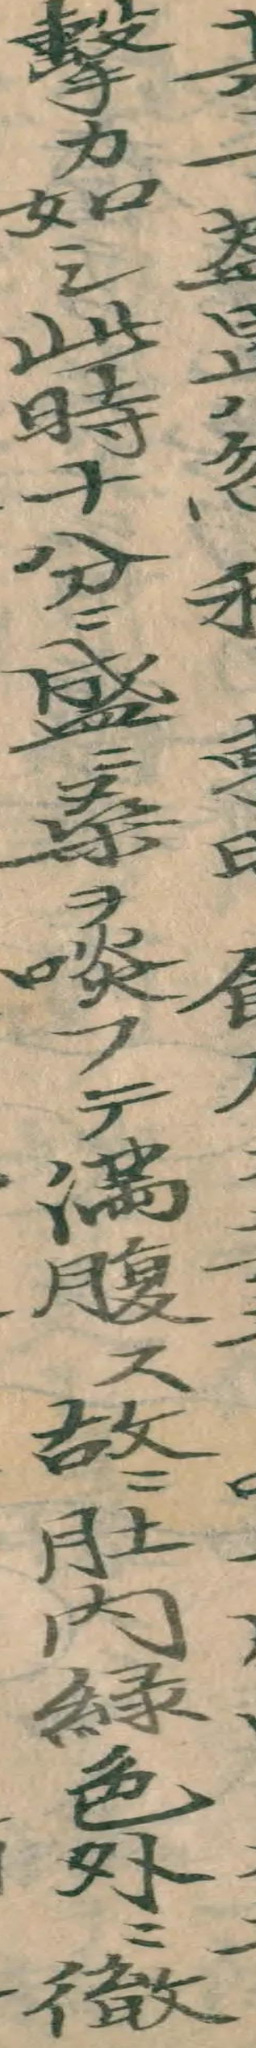撃カ如シ此時十分ニ盛ニ桑ヲ啖フテ満腹ス故ニ肚内緑色外ニ徹
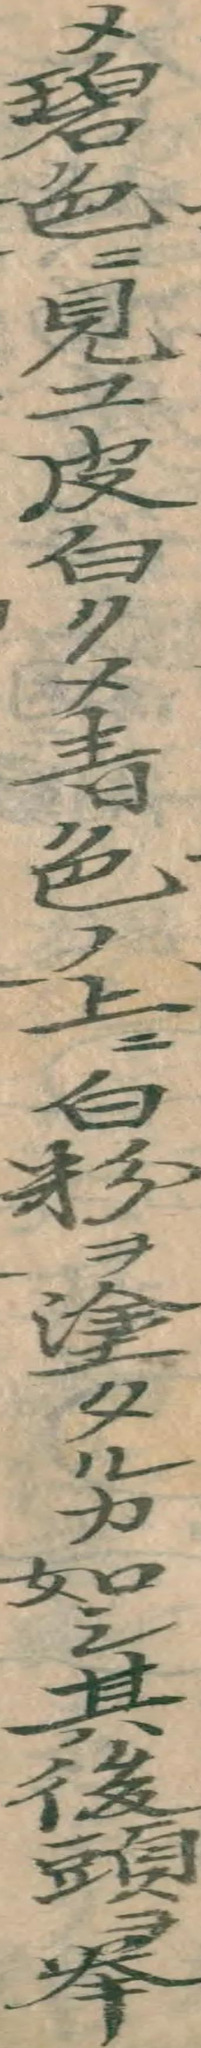シテ碧色ニ見ユ皮白クシテ青色ノ上ニ白粉ヲ塗タルカ如シ其後頭ヲ挙
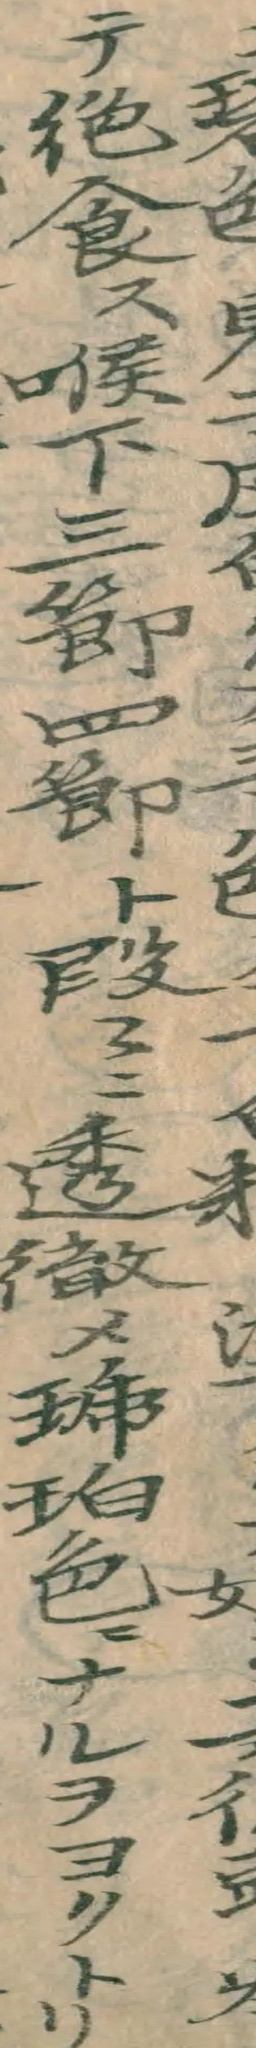テ絶食ス喉下三節四節ト段〻ニ透徹シテ琥珀色ニナルヲヨクトリ
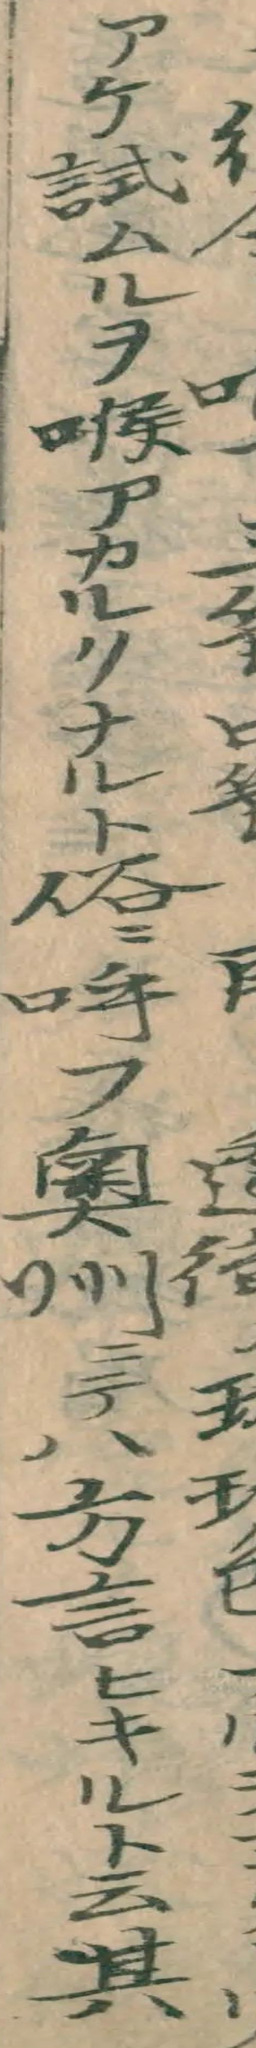アケ試ムルヲ喉アカルクナルト俗ニ呼フ奥州ニテハ方言ヒキルト云其

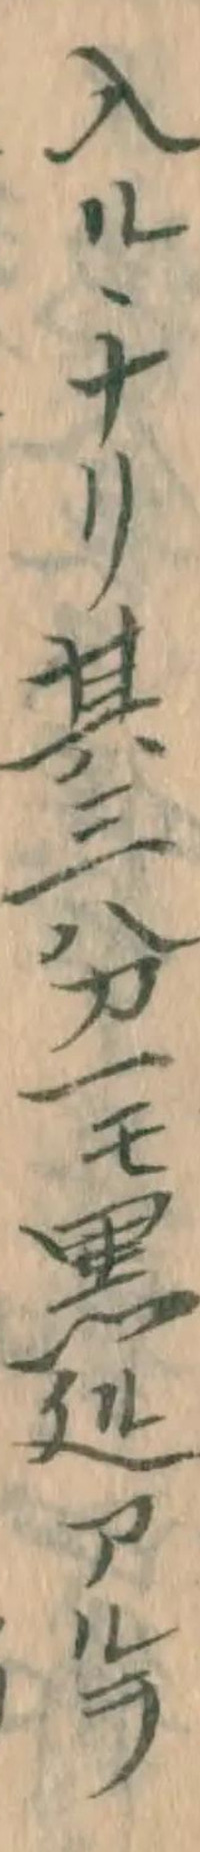入ルヽナリ其三分一モ黒処アルヲ
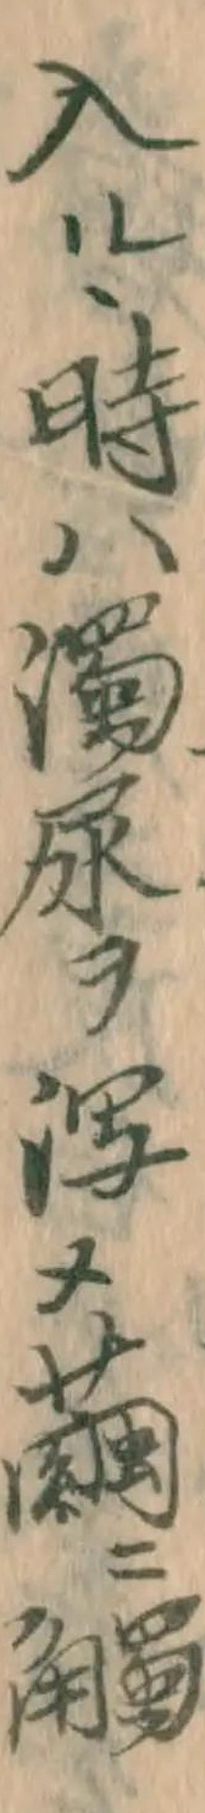入ルヽ時ハ濁尿ヲ泻シテ繭ニ觸
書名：千蟲譜 3巻. [1]
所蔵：国立国会図書館 National Diet Library, JAPAN
